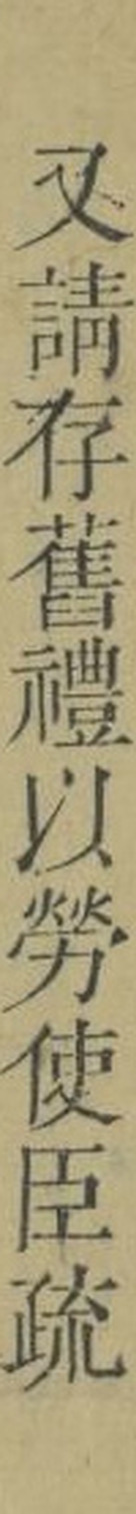又請存舊禮以勞使臣疏
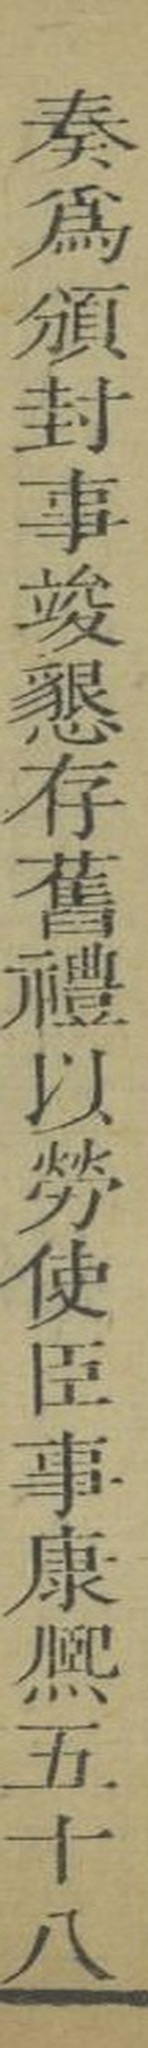奏爲領封事竣懇存舊禮以勞使臣事康熈五十八
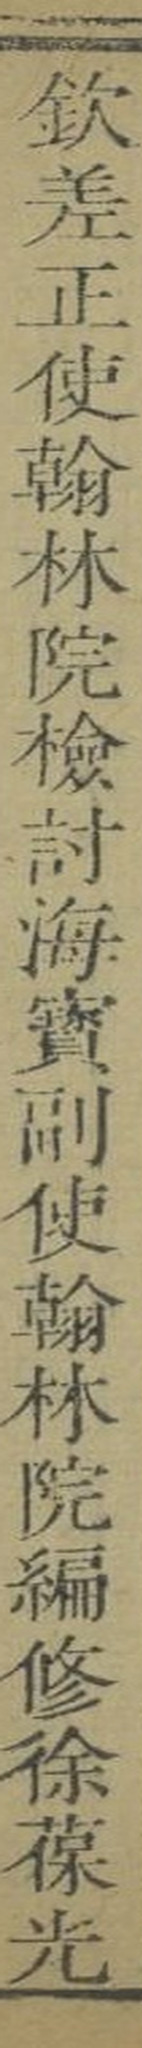欽差正使翰林院檢討海寶副使翰林院編修徐葆光
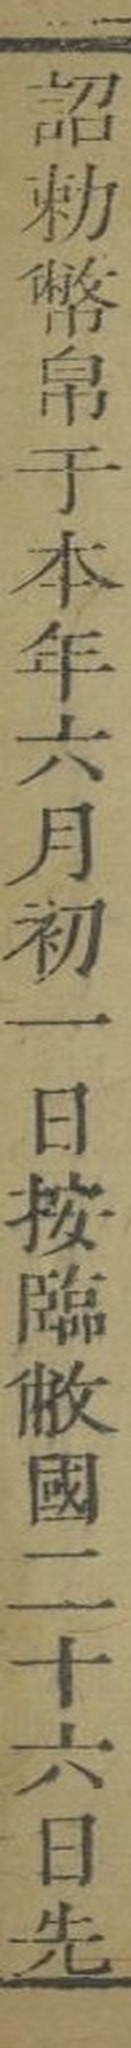詔勅幣帛于本年六月初一日按臨敝國二十六日先

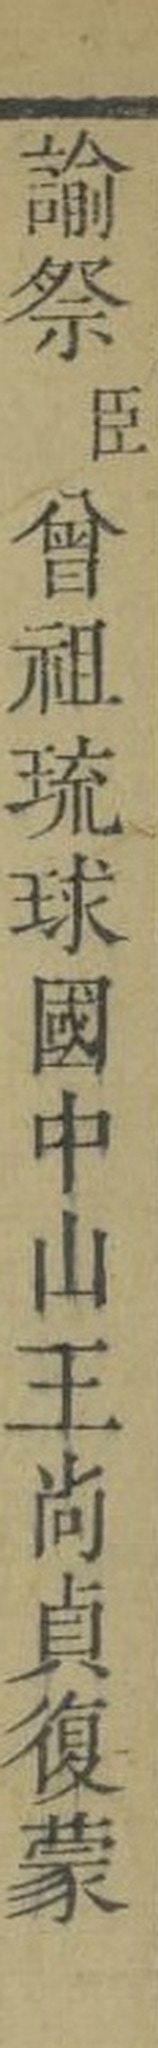諭祭臣曾祖琉球國中山王尚貞復蒙
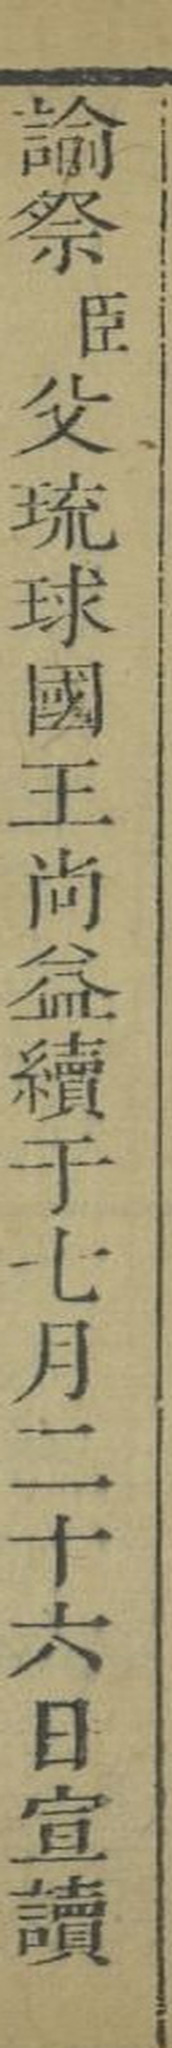諭祭臣父琉球國王尚益續于七月二十六日宣讀
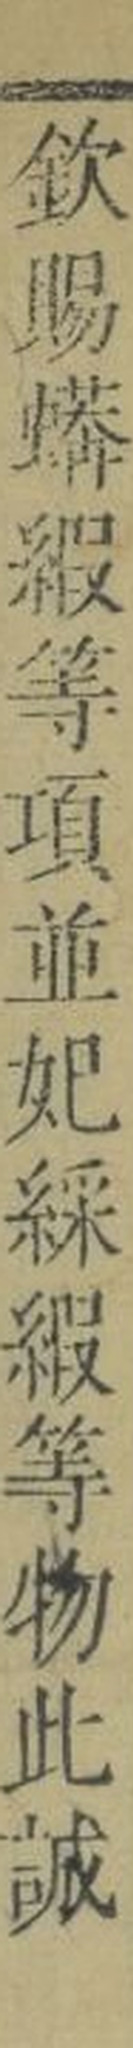欽賜蠎縀等項並妃綵縀等物此誠
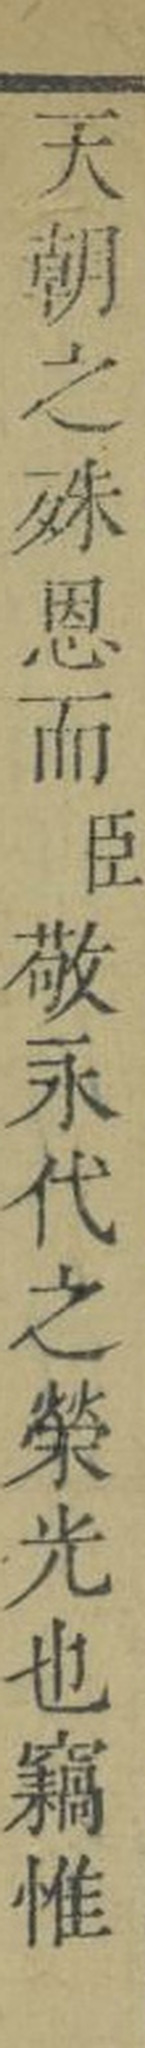天朝之殊恩而臣敬永代之榮光也竊惟
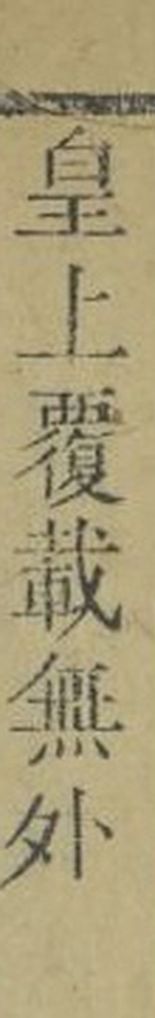皇上覆載無外
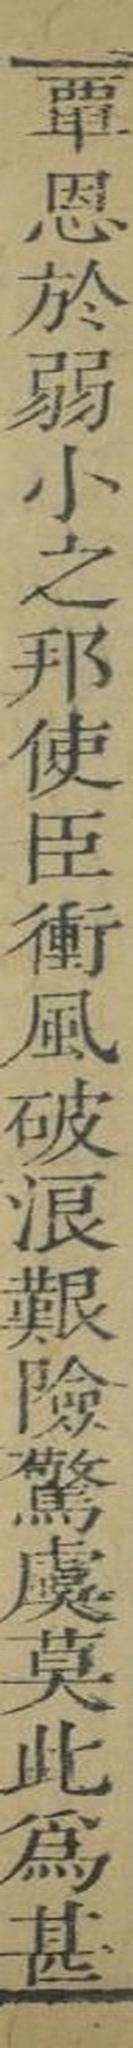覃恩於弱小之邦使臣衝風破浪艱險驚虞莫此爲甚
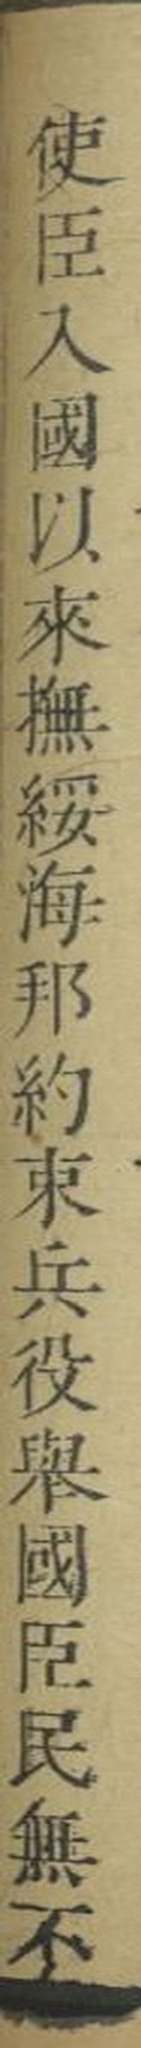使臣入國以來撫綏海邦約束兵役舉國臣民無不
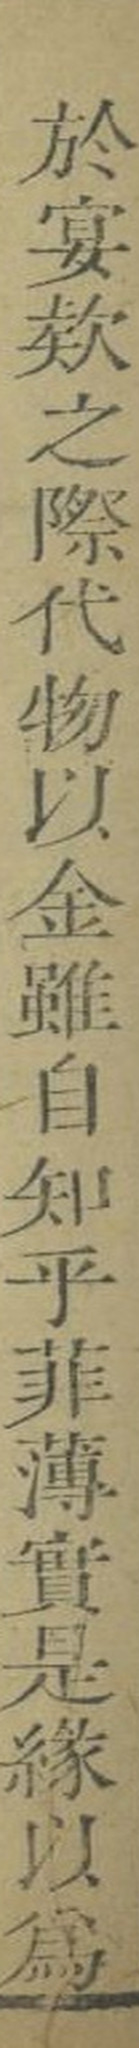於宴欵之際代物以金雖自知乎菲薄實是緣以爲
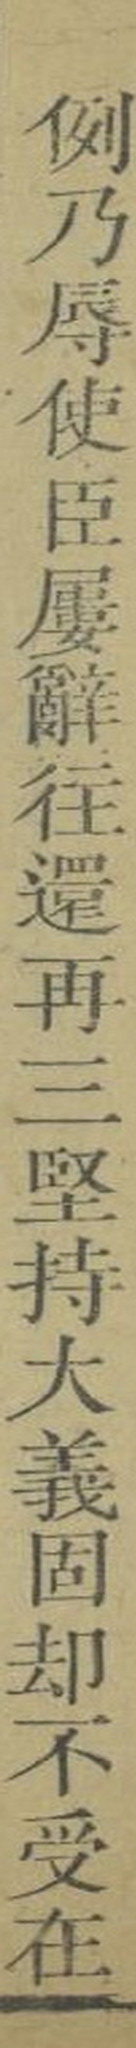例乃辱使臣屢辭往還再三堅持大義固却不受在
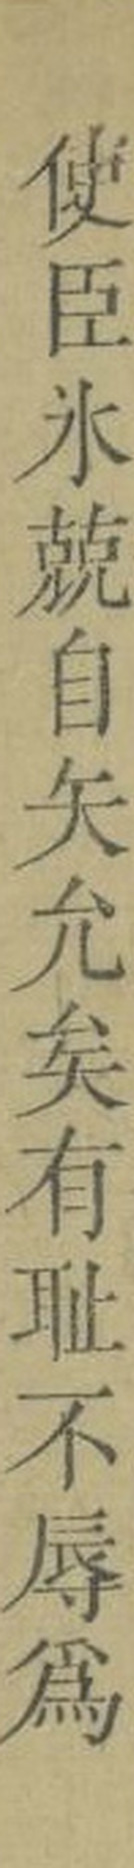使臣氷兢自矢允矣有耻不辱爲
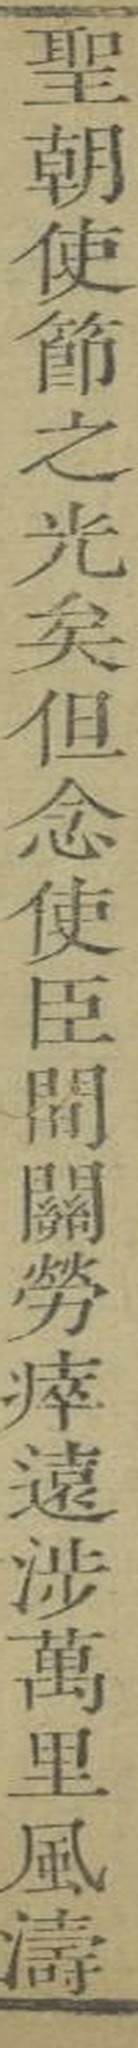聖朝使節之光矣但念使臣間關勞瘁遠涉萬里風濤
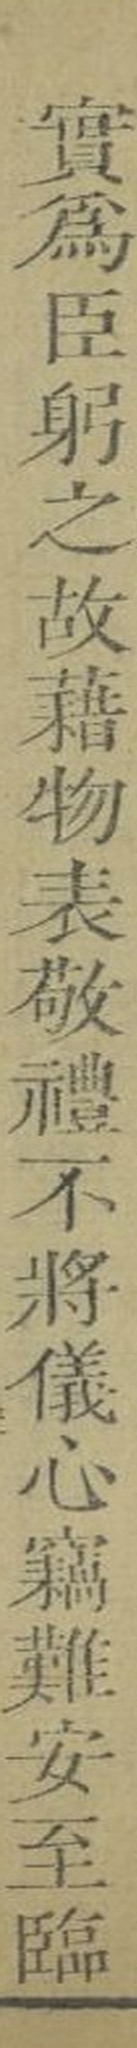實爲臣躬之故藉物表敬禮不將儀心竊難安至臨
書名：中山伝信録 巻二
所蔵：University of the Ryukyus Library
